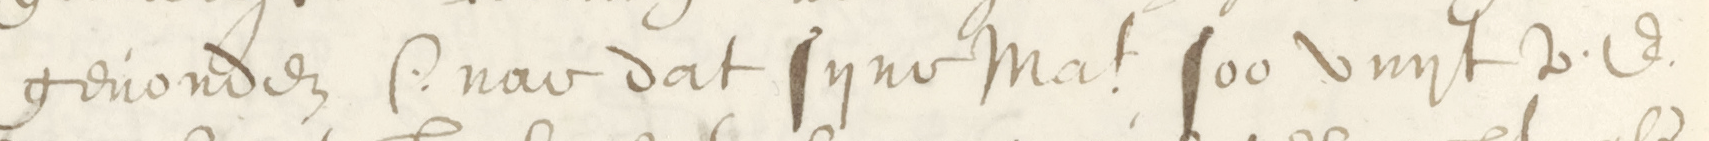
geuonden (: nae dat syne Mat. soo vuyt u. E.
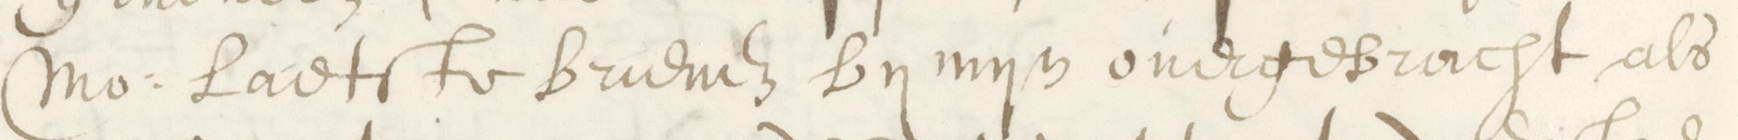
Mo: laetste brieven by myn ouergebracht als
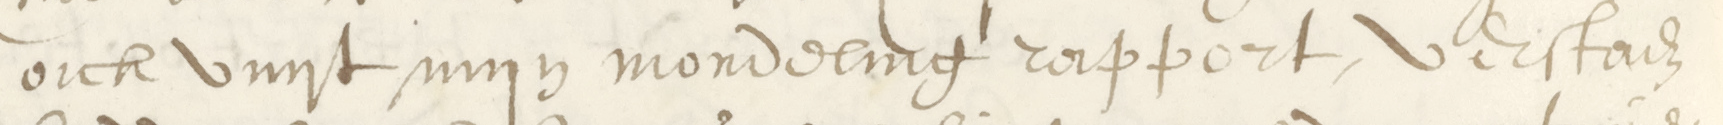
oick vuyt myn mondeling rapport, verstaen
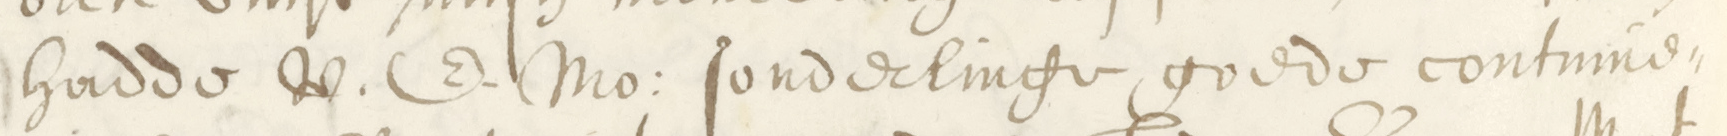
hadde u. E. Mo: sonderlinge goede continue,,
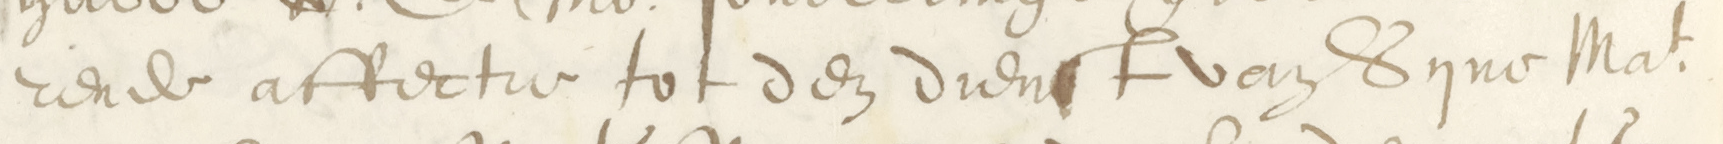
rende affectie tot den dienst van Syne Mat.
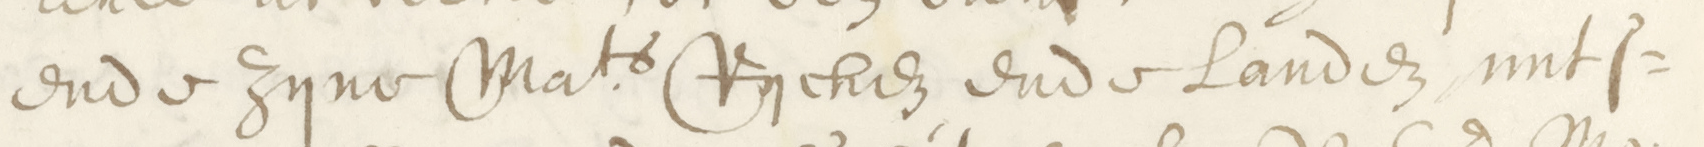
ende zyne Mats. Rycken ende Landen, mits„
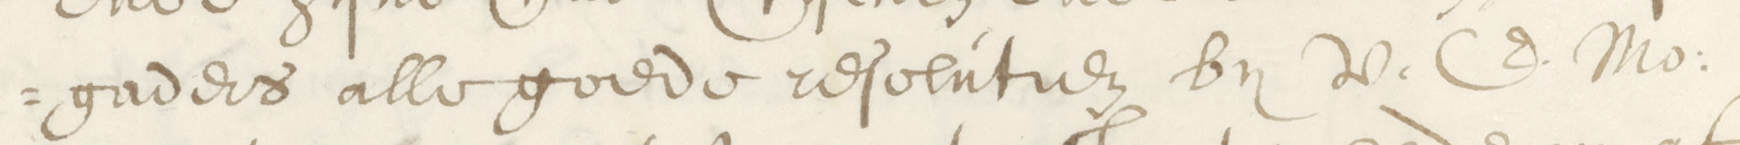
„gaders alle goede resolutien bij u. E: Mo:
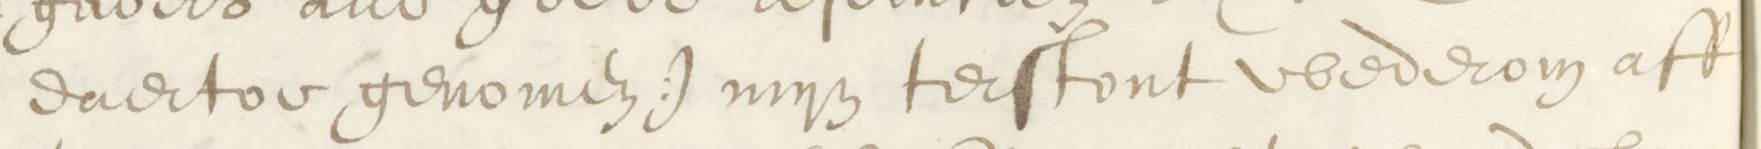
daertoe genomen :) myn terstont wederom aff
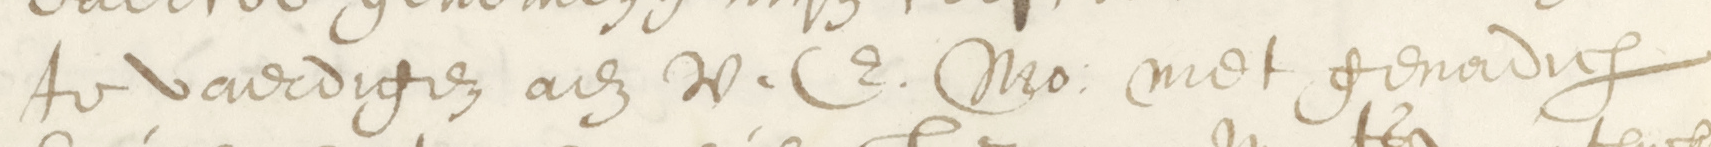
te vaerdigen aen u. E. Mo: met genadich
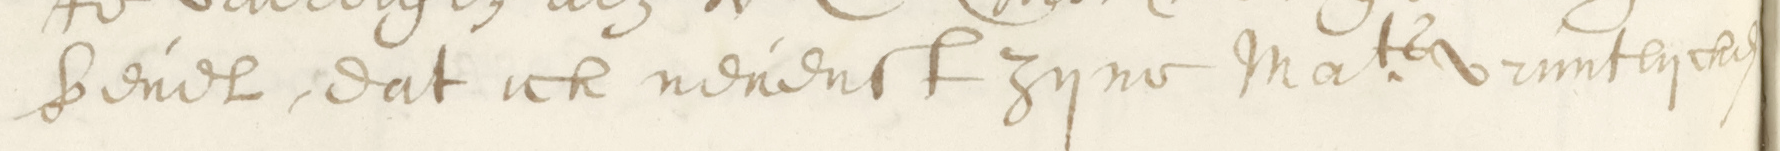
beuel, dat ick nevenst zyne Mat. vruntlycken
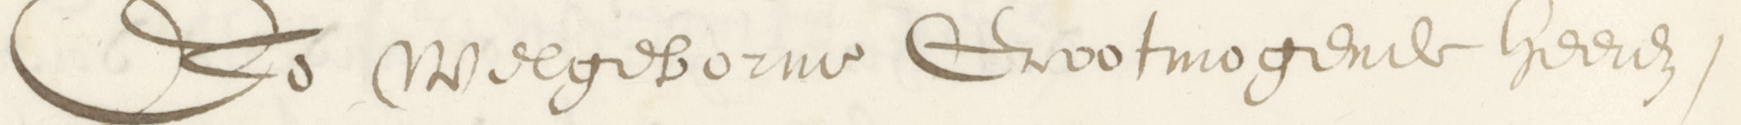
De Welgeborne Grootmogende heeren.
